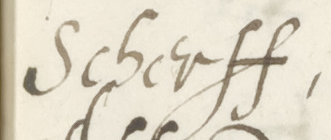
Scherff,
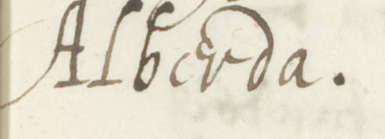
Alberda.
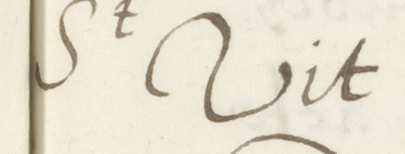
St Vit
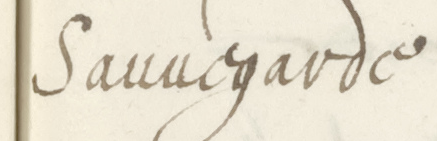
Sauuegarde
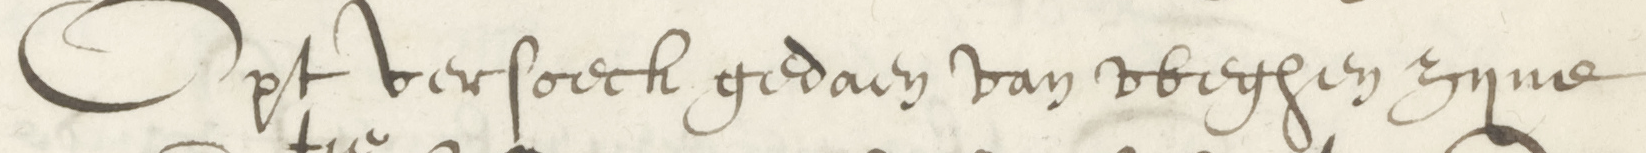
Opt versoeck gedaen van weghen zyne
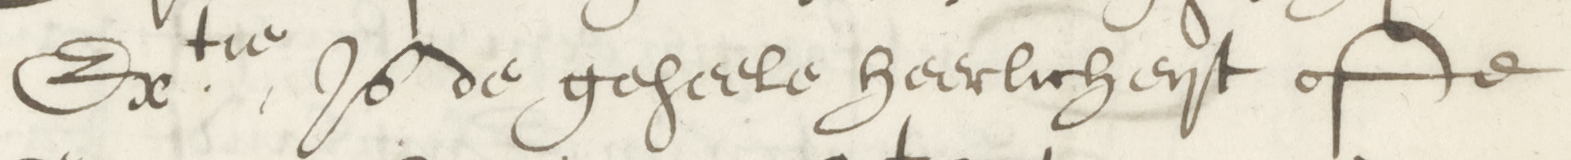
Extie, Is de geheele heerlicheyt ofte
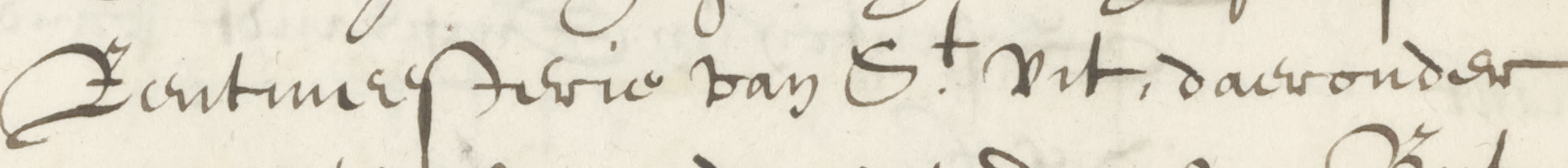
Rentmeesterie van St. Vit, daeronder
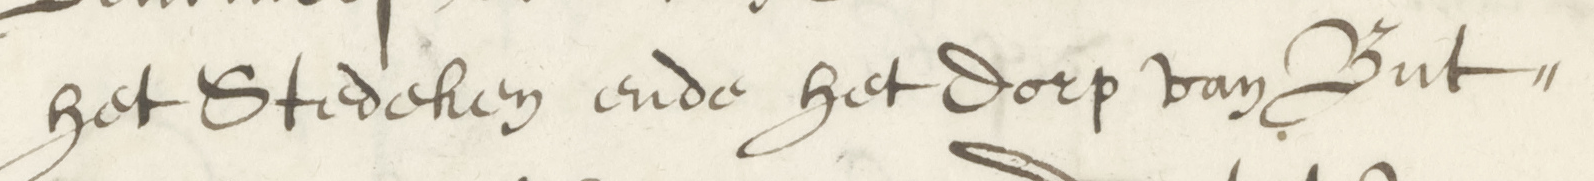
het Stedeken ende het dorp van But„
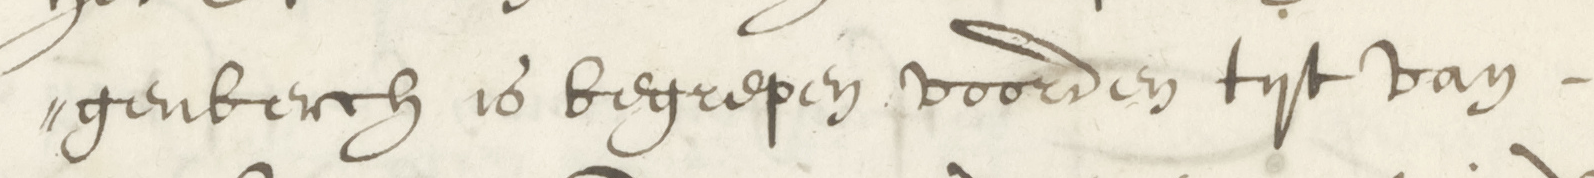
„genberch is begrepen voorden tyt van
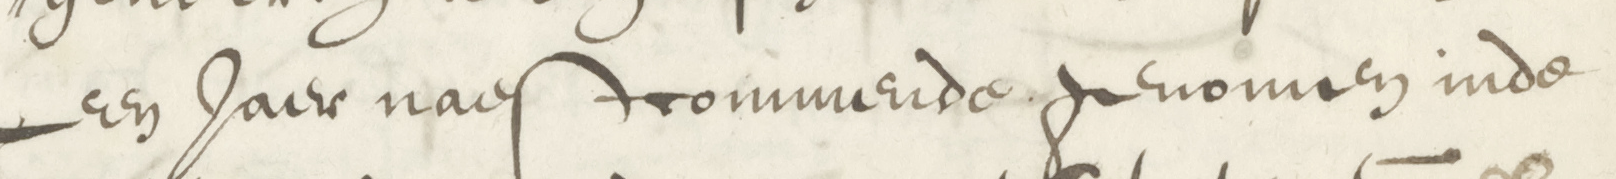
een jaer naestcommende genomen inde
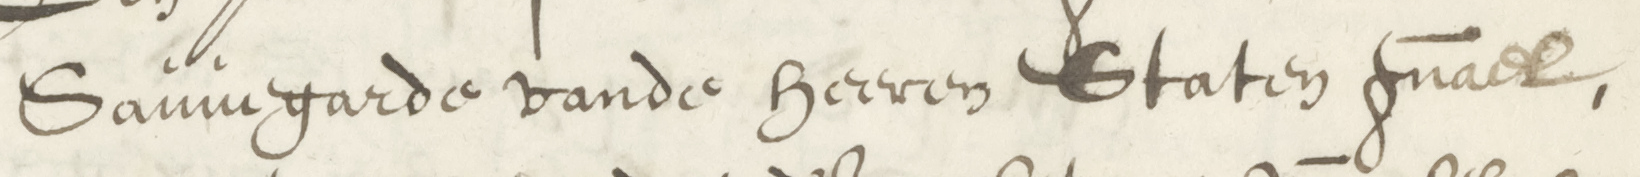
Sauuegarde vande heeren Staten Gnael,
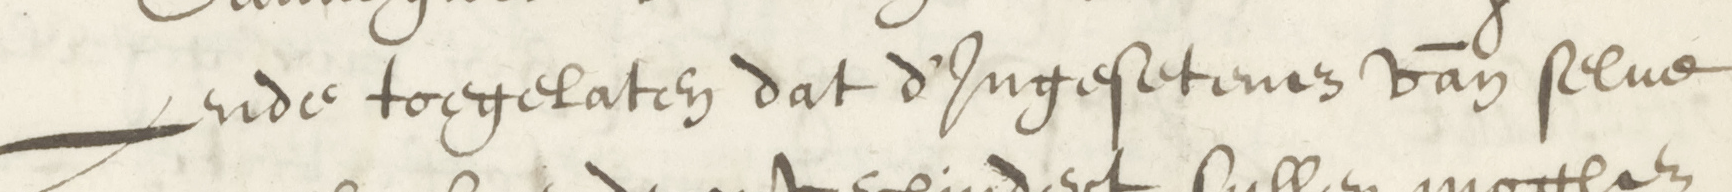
ende toegelaten dat d‛Ingesetenen van selue
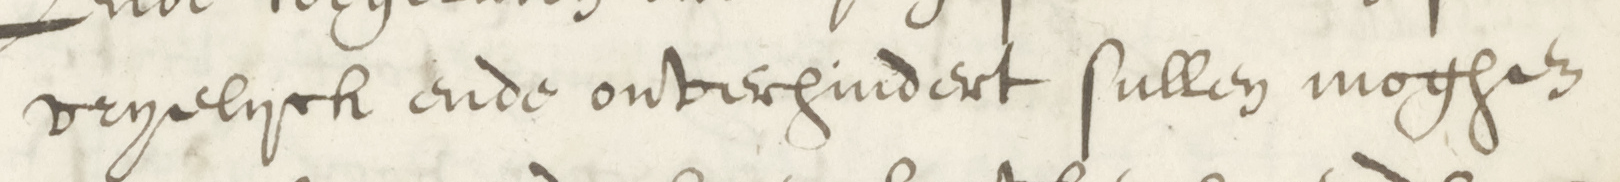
vryelyck ende onverhindert sullen moghen
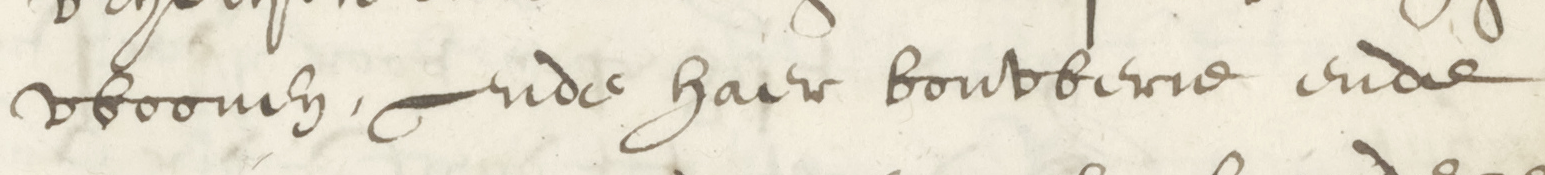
woonen, ende haer bouwerie ende
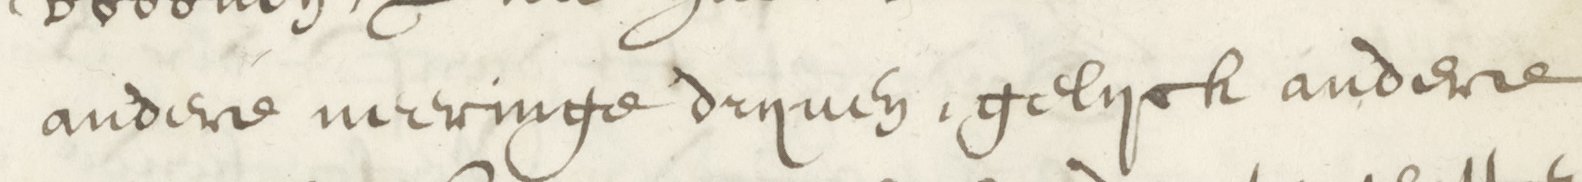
andere neeringe dryuen, gelyck andere
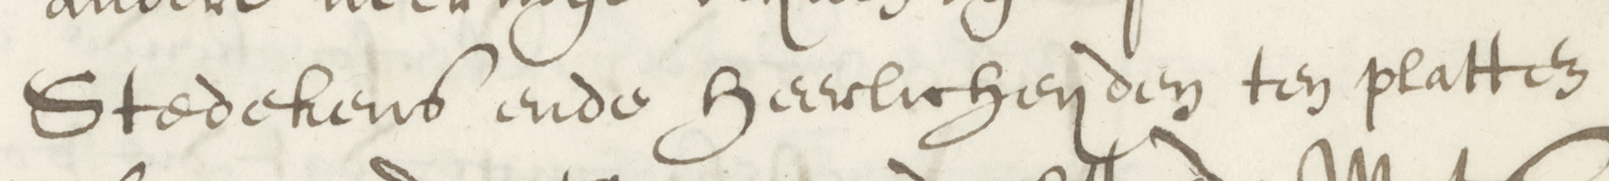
Stedekens ende heerlicheyden ten platten
